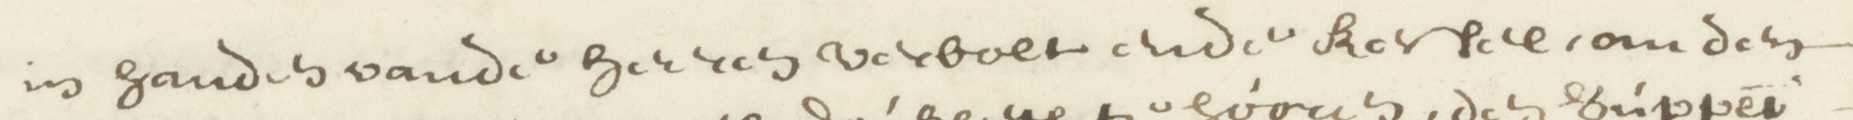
in handen vande heeren Vervoet ende Kercke om den
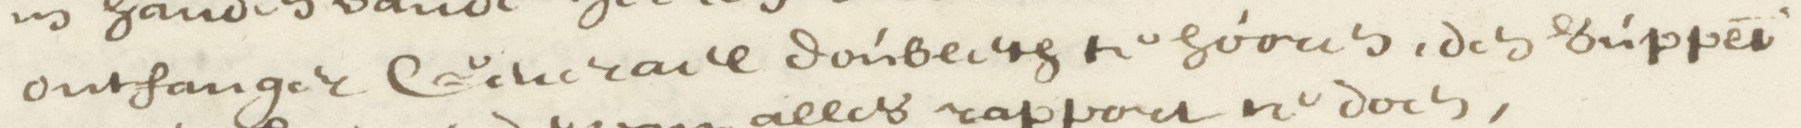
ontfanger Generael Doubleth te hooren, den Supplt
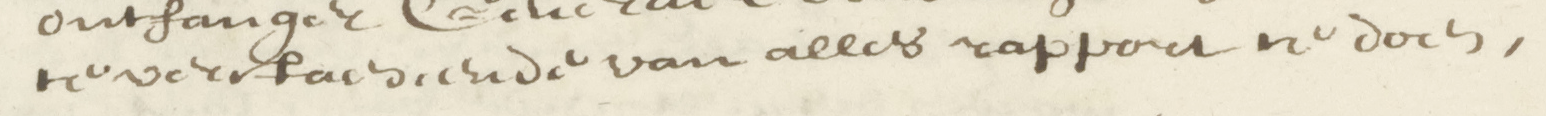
te verstaen ende van alles rapport te doen.
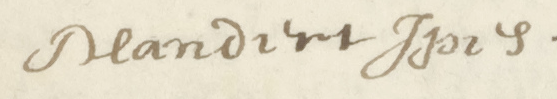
Mandert Ipes
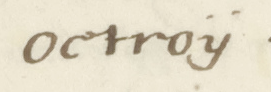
octroij
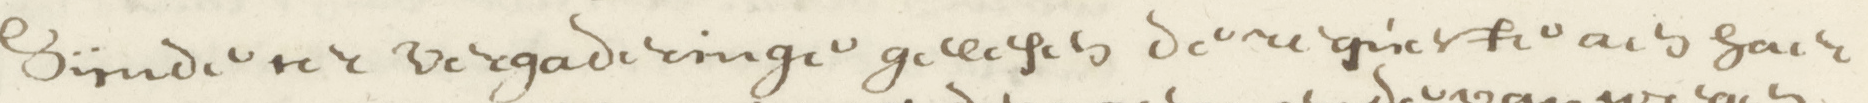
Sijnde ter vergaderinge gelesen de requeste aen haer
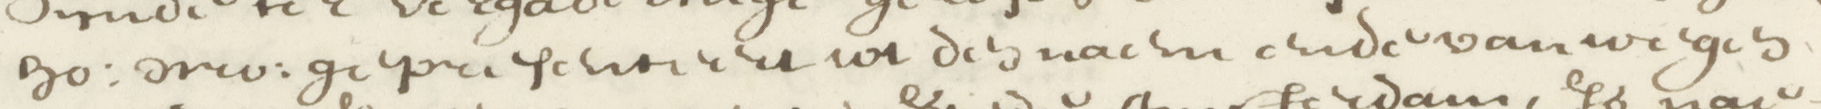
Ho:Mo: gepresenteert wt den naem ende van wegen
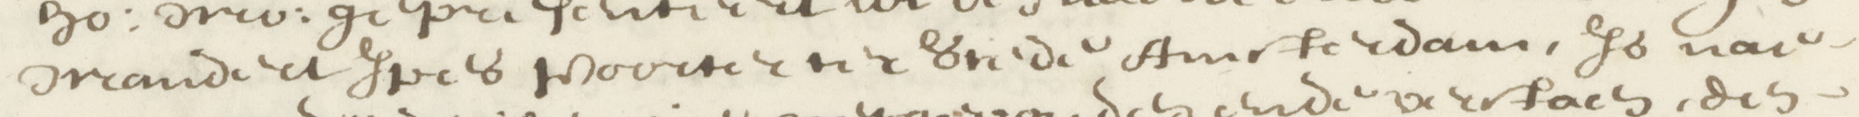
Mandert Ipes poorter ter stede Amsterdam, Is nae
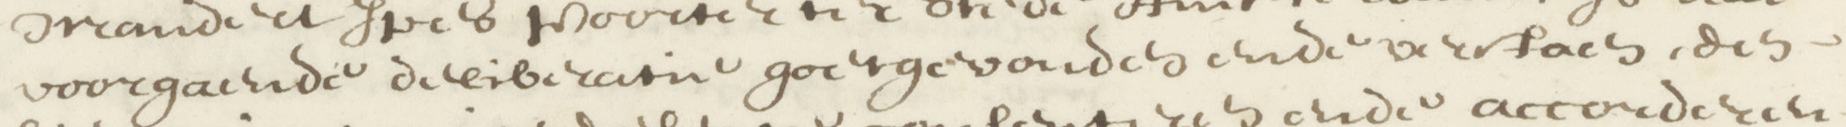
voorgaende deliberatie goetgevonden ende verstaen, den
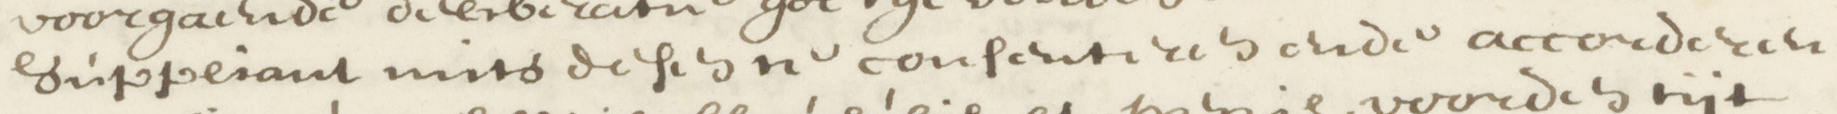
Suppliant mits desen te consenteren ende accorderen
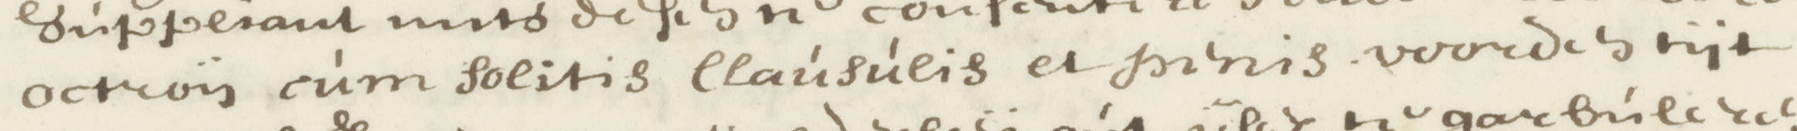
octroij cum solitis clausulis et penis voorden tijt
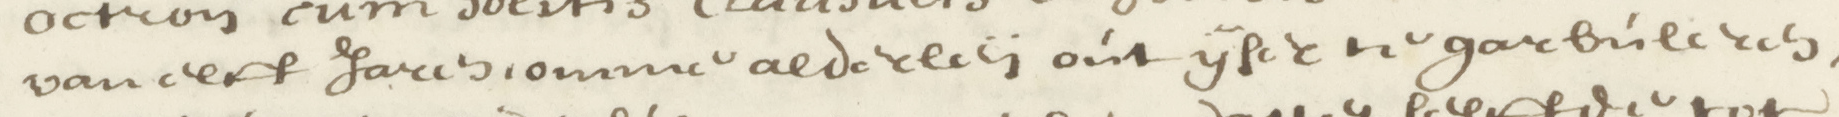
van elff Jaren, omme alderleij out ijser te garbuleren,
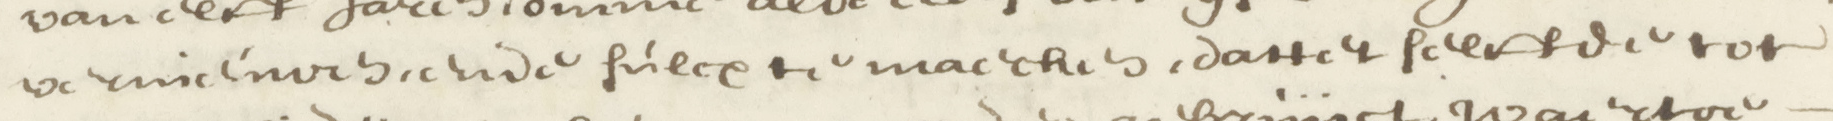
vernieuwen, ende sulcx te maecken, dattet selffde tot
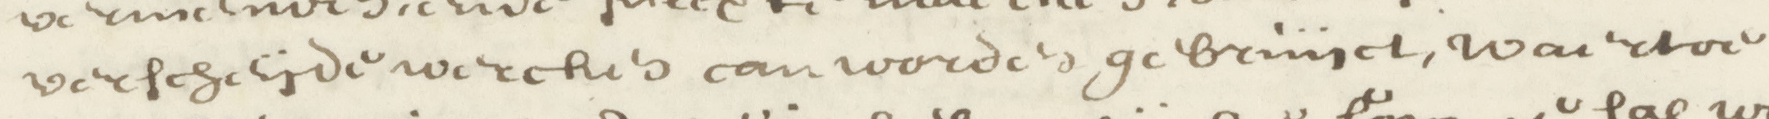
verscheijde wercken can worden gebruijct, waertoe
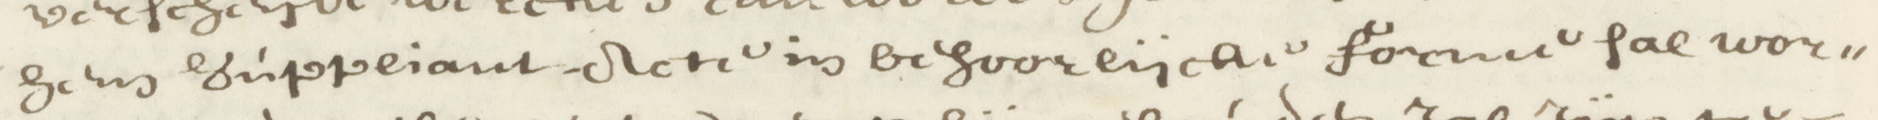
hem Suppliant Acte in behoorlijcke forme sal wor„
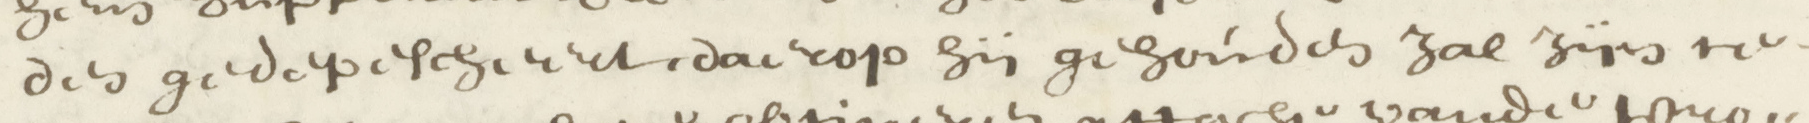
den gedepescheert, daerop hij gehouden zal zijn te
